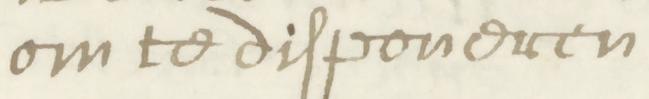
om te disponeren.
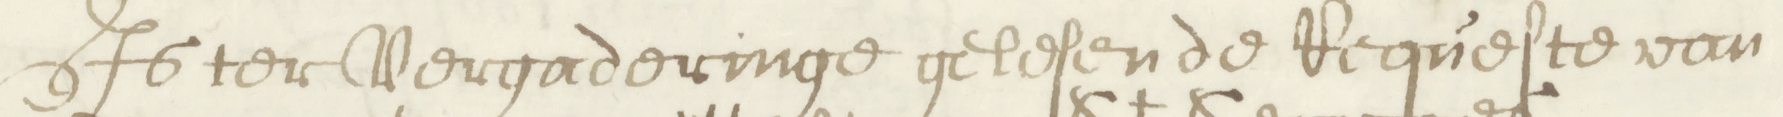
Is ter Vergaderinge gelesen de Requeste van
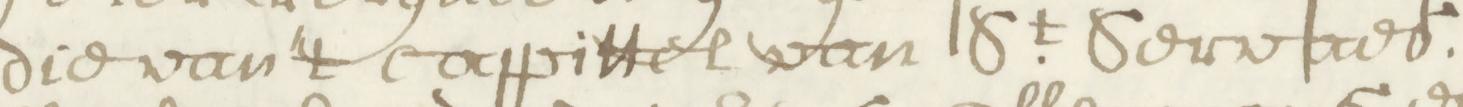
die van't cappittel van St. Servaes,
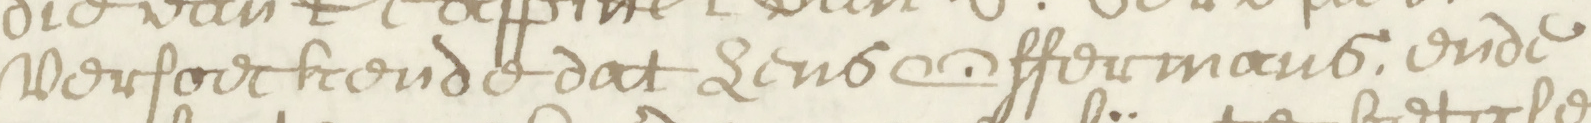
Versoeckende dat Lens Offermans, ende
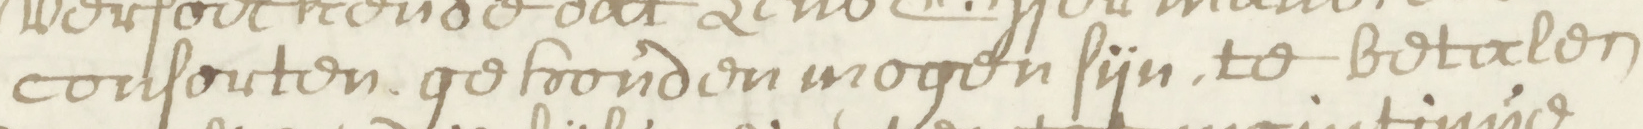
consorten gehouden mogen sijn, te betalen
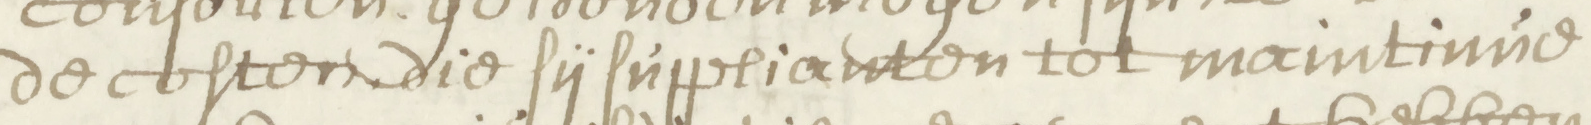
de costen die sij supplianten tot maintinue
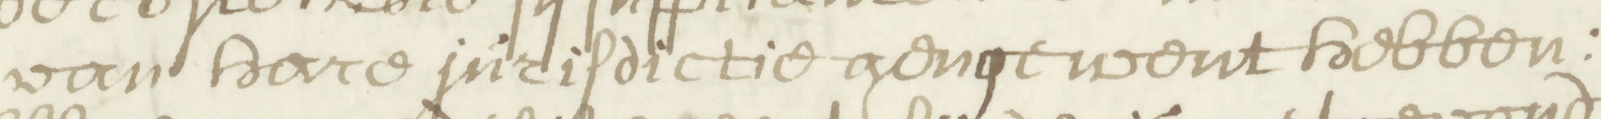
van hare jurisdictie aengewent hebben:
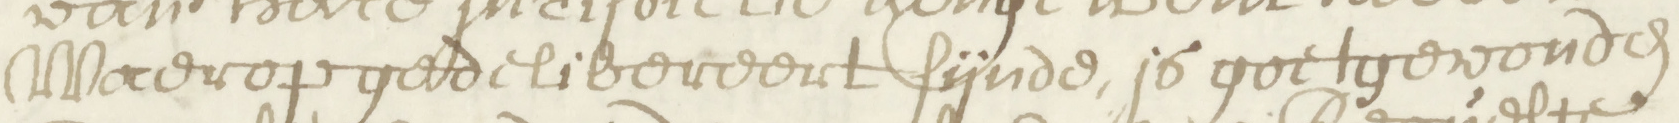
Waerop gedelibereert sijnde, is goetgevonden,
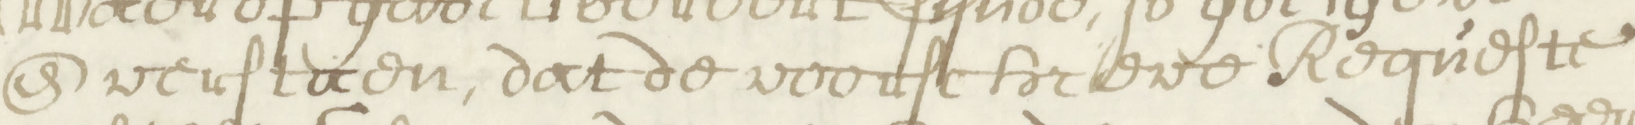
& verstaen, dat de voorschreve Requeste
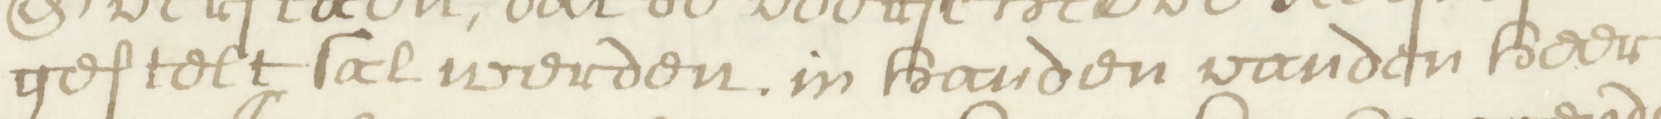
gestelt sal werden, in handen van den heer
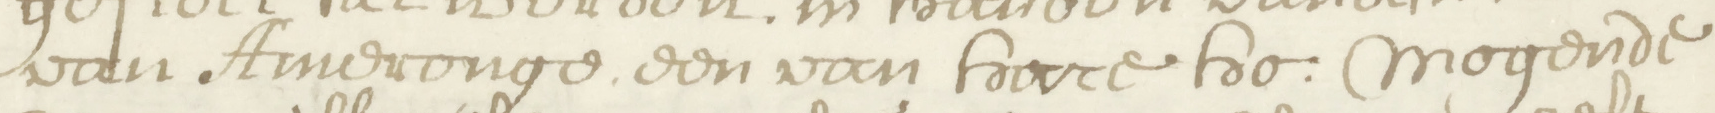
van Ameronge, een van hare ho: Mogende
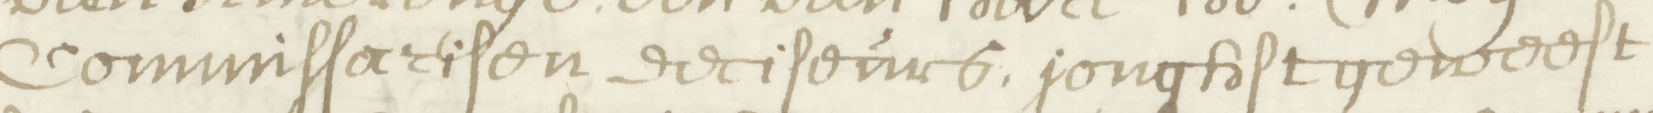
Commissarisen deciseurs, jonghst geweest
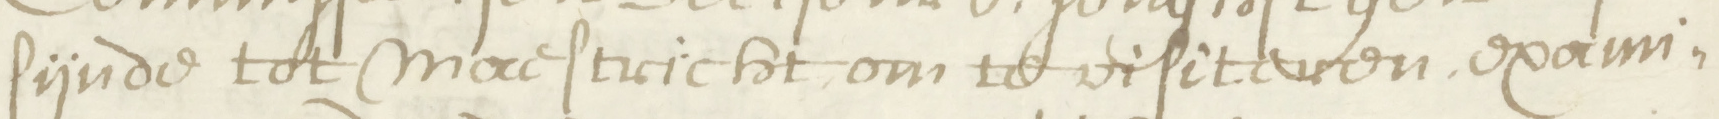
sijnde tot Maestricht, om te visiteren, exami,,
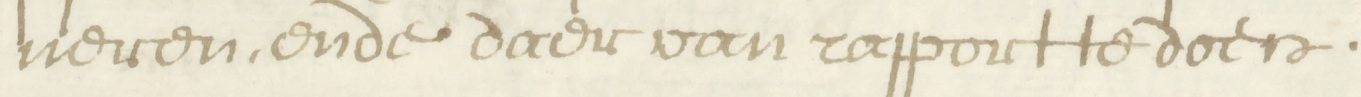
neren, ende daer van rapport te doen.
